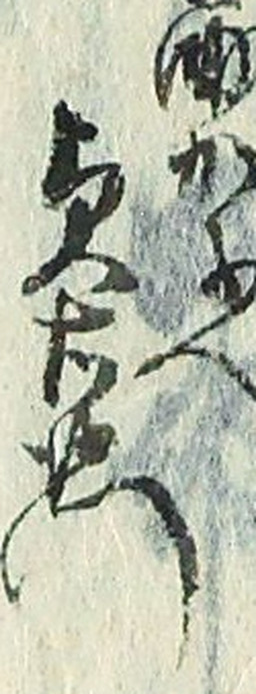常右衛門
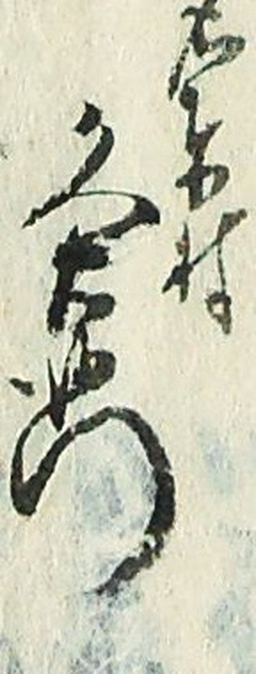常右衛門
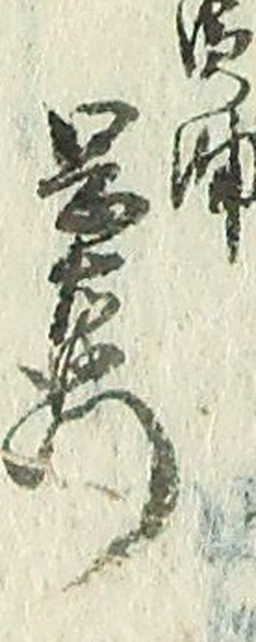常右衛門
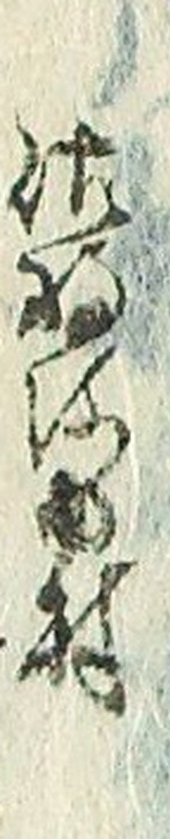佐那河内村
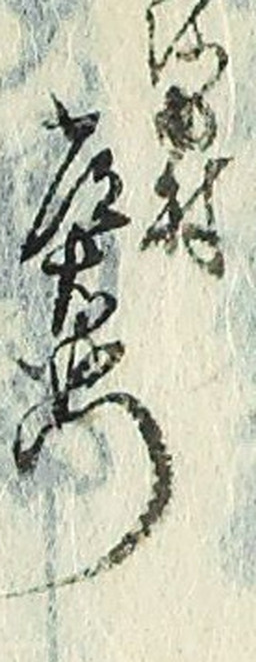常右衛門
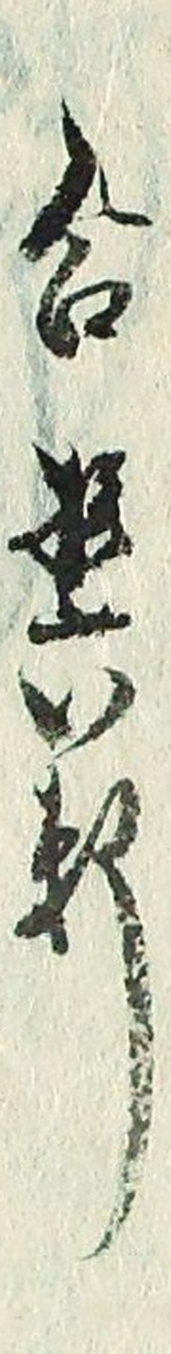合拾六軒
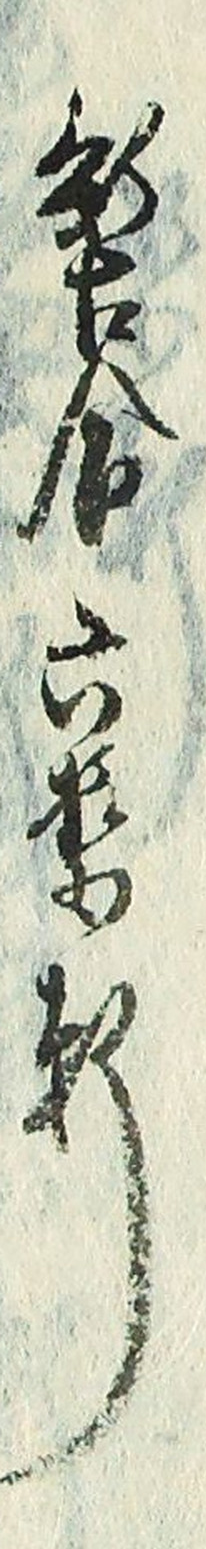新古合六拾五軒
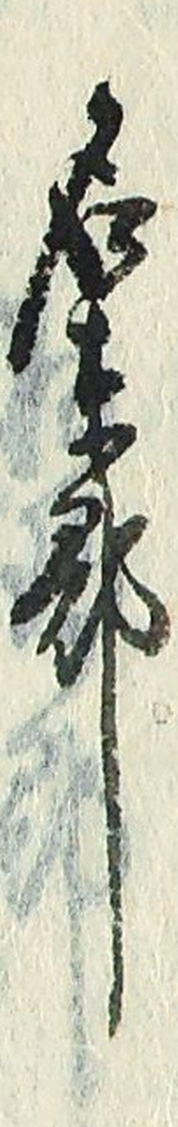名東郡
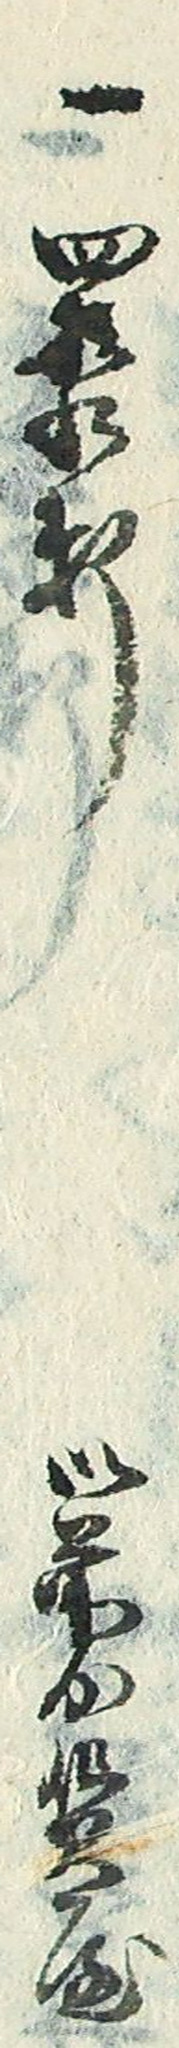一四拾九軒以前ゟ質屋
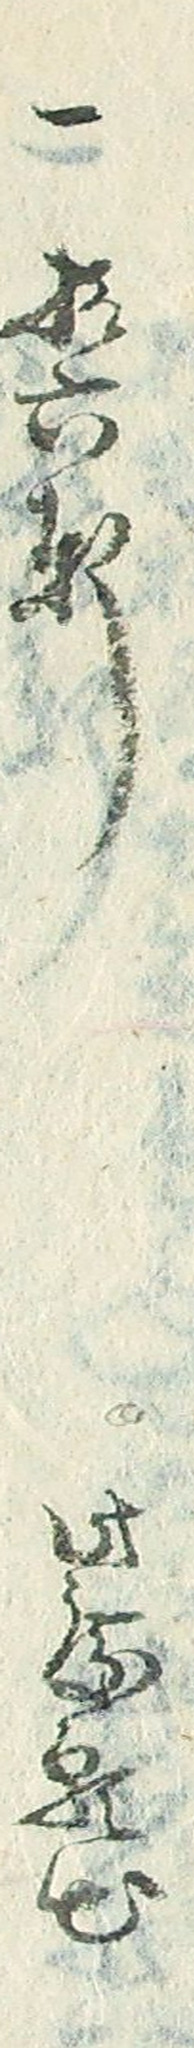一拾六軒此度願出
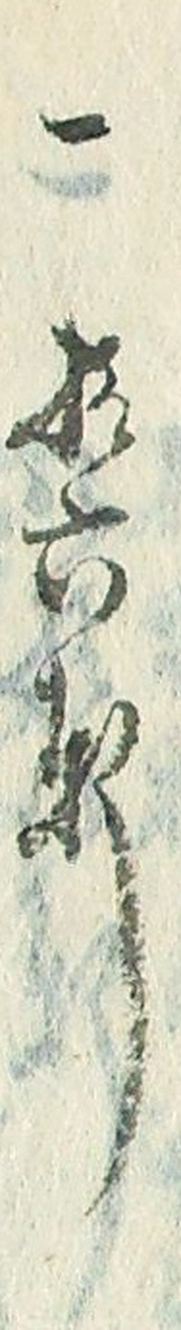合拾六軒
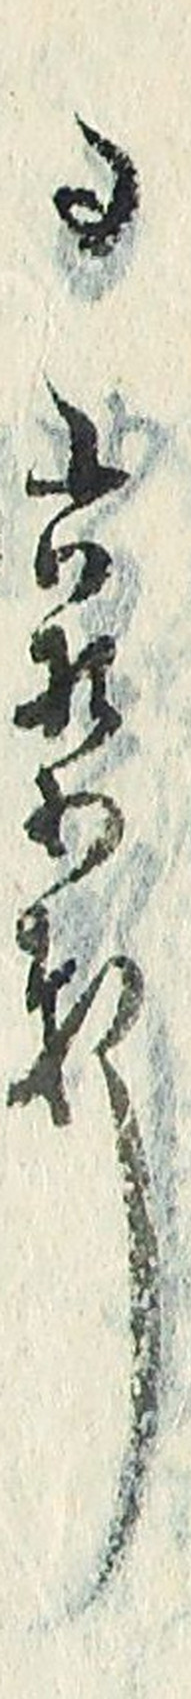〆六拾五軒

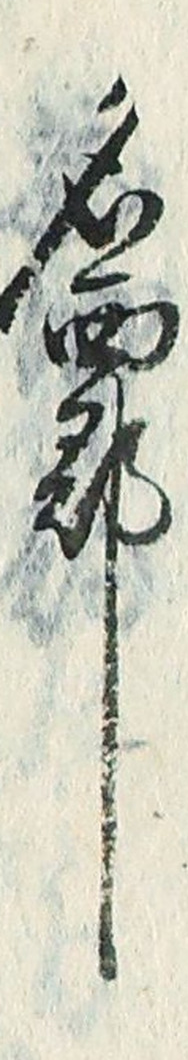名西郡
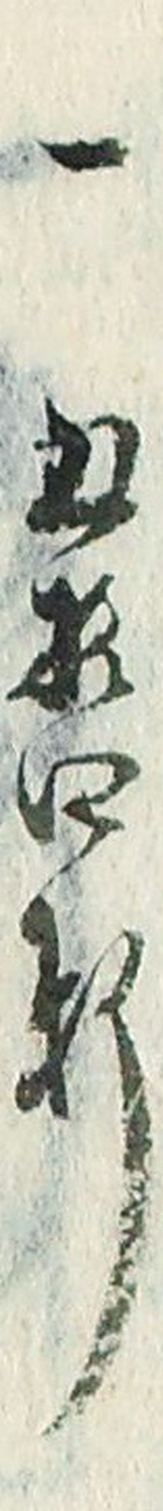一三拾九軒
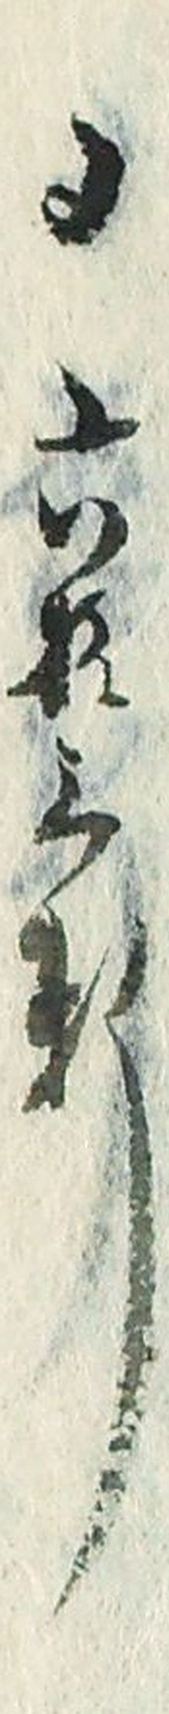〆六拾三軒
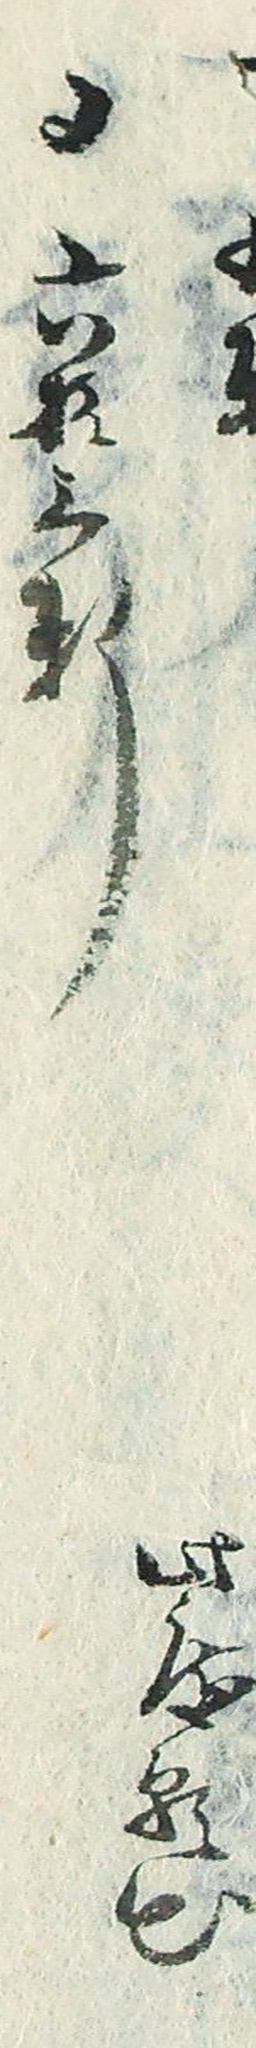〆六拾四軒此度願出
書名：市郷質屋株御取究並御書出御趣法之写
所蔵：鳴門教育大学 Naruto University of Education
